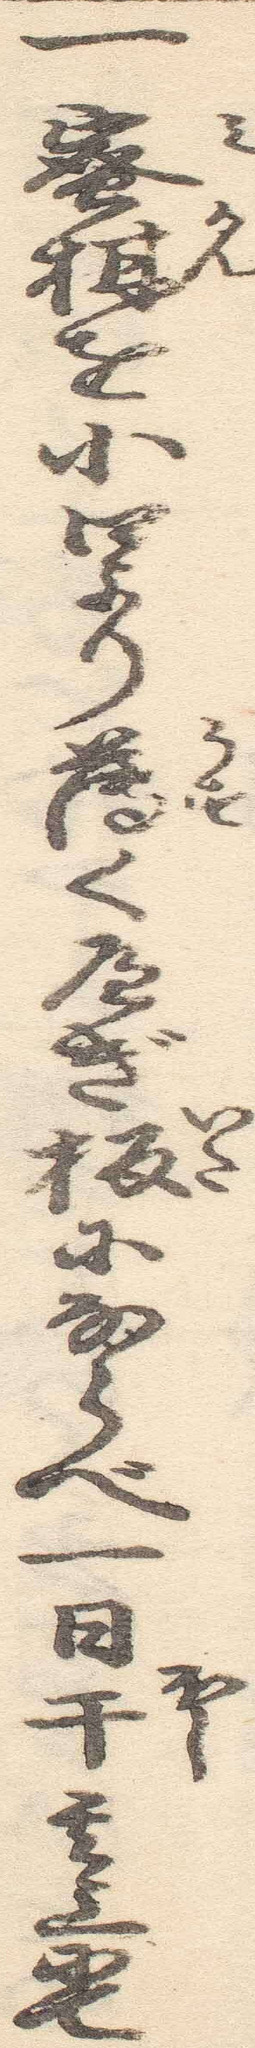一蜜柑を小口より薄くへぎ板にならべ一日干其上にて
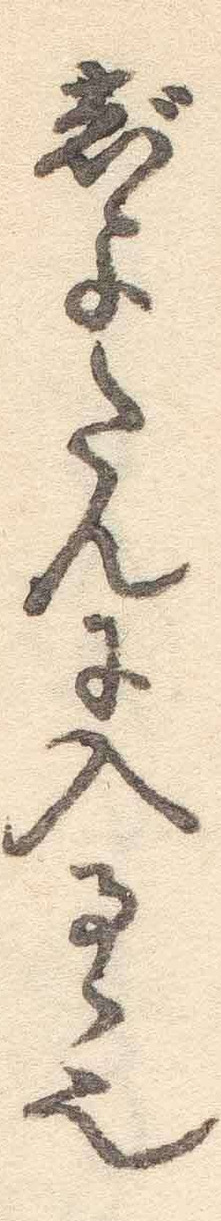じよたんに入るゝ也
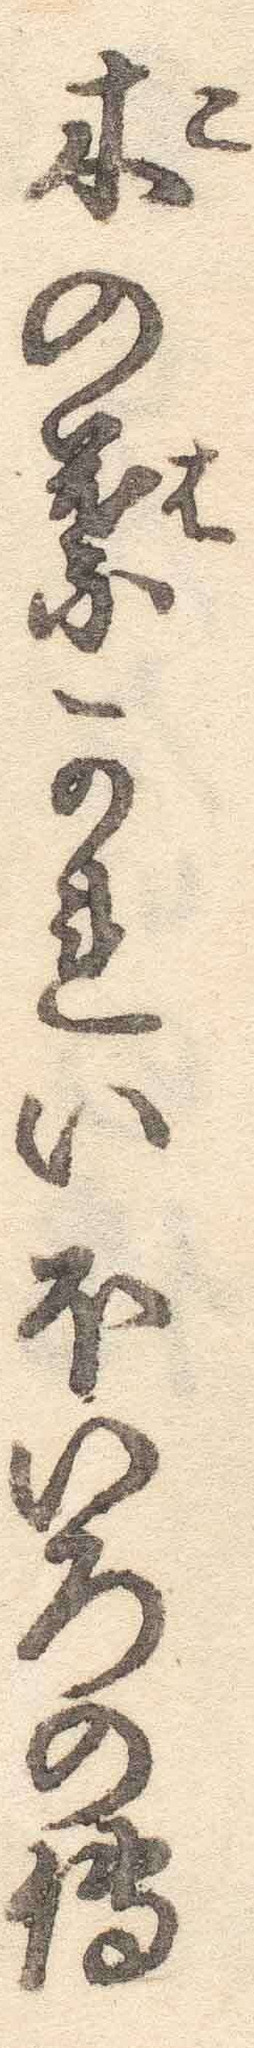木の葉かれいほいろの伝
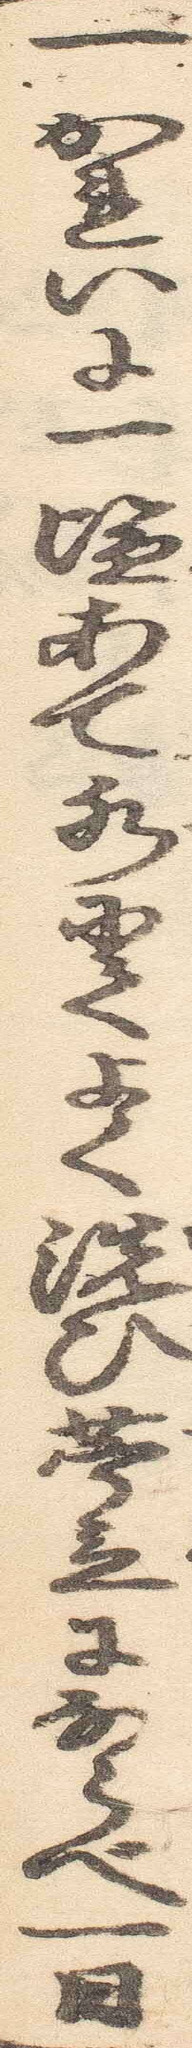一かれいに一塩あて水にてよく洗ひ苧立にならべ一日
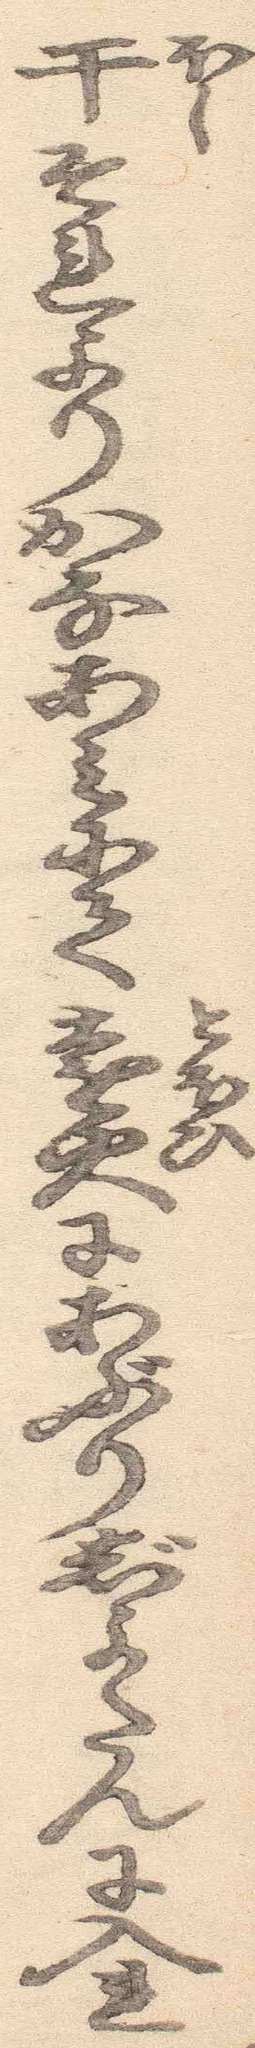干それよりかなあみにて遠火にあぶりじよたんに入れ
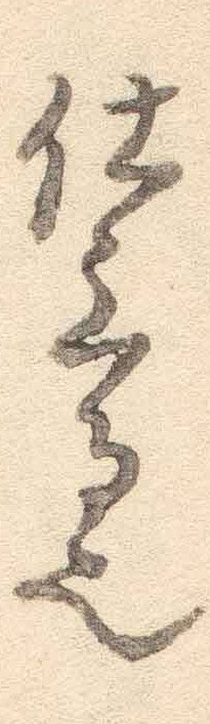仕上る也
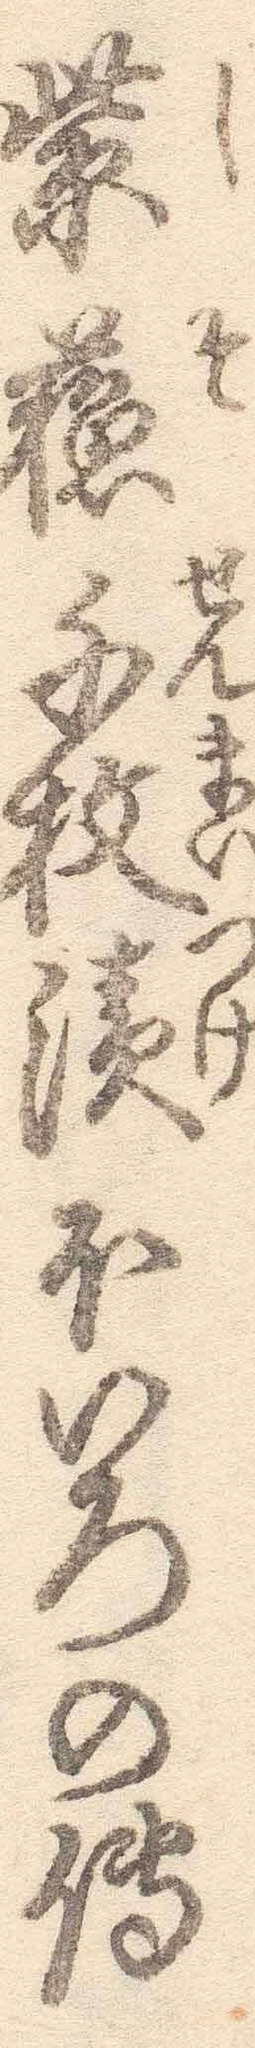紫蘇千枚漬ほいろの伝
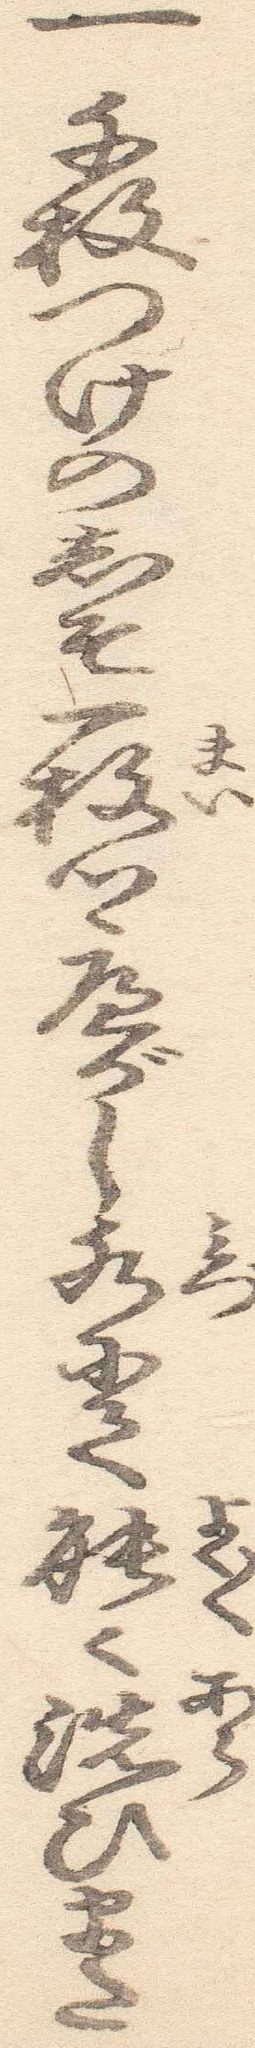一千枚つけのしそ一枚つゝへがし水にて能々洗ひまた
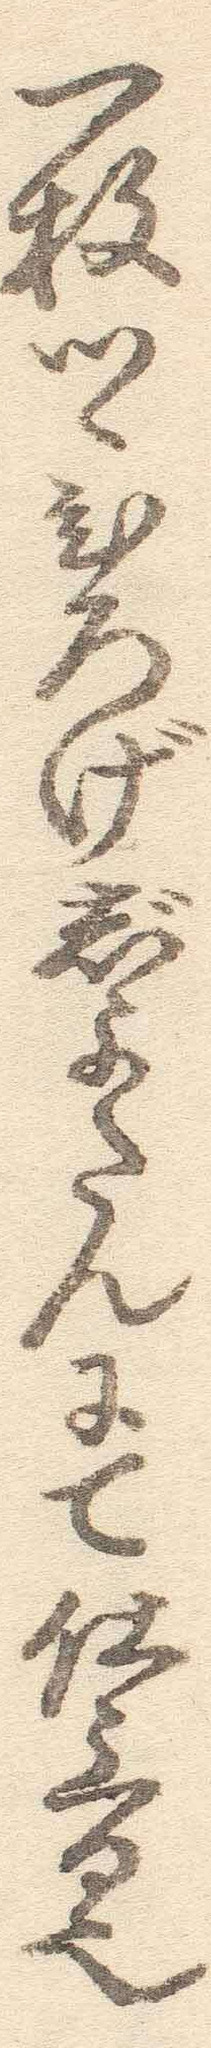一枚つゝひろげじよたんにて仕上る也
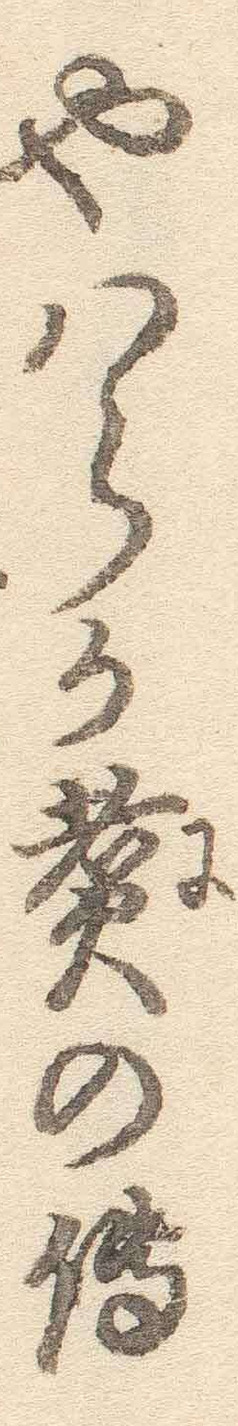やはらか煮の伝
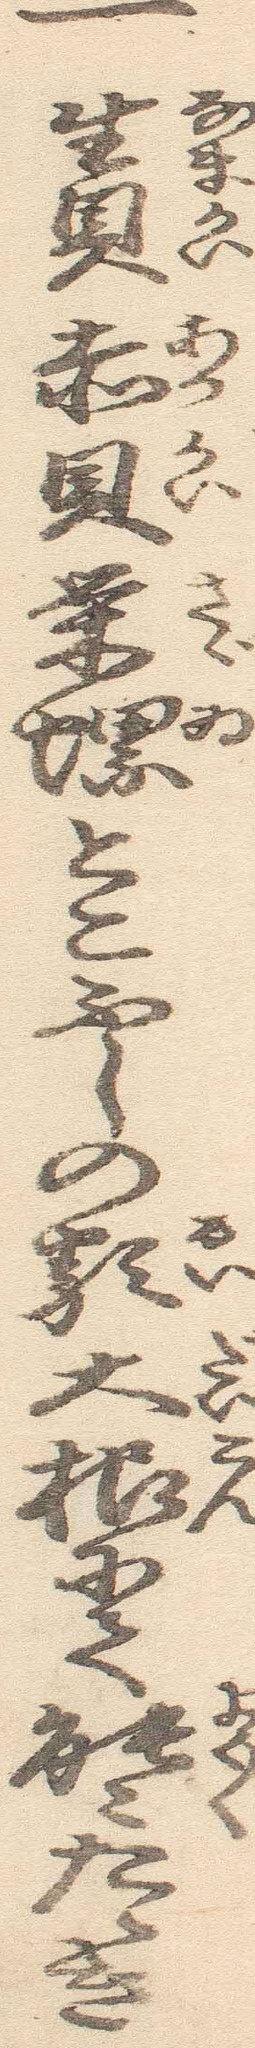一生貝赤貝栄螺とこふしの類大根にて能々たゝき
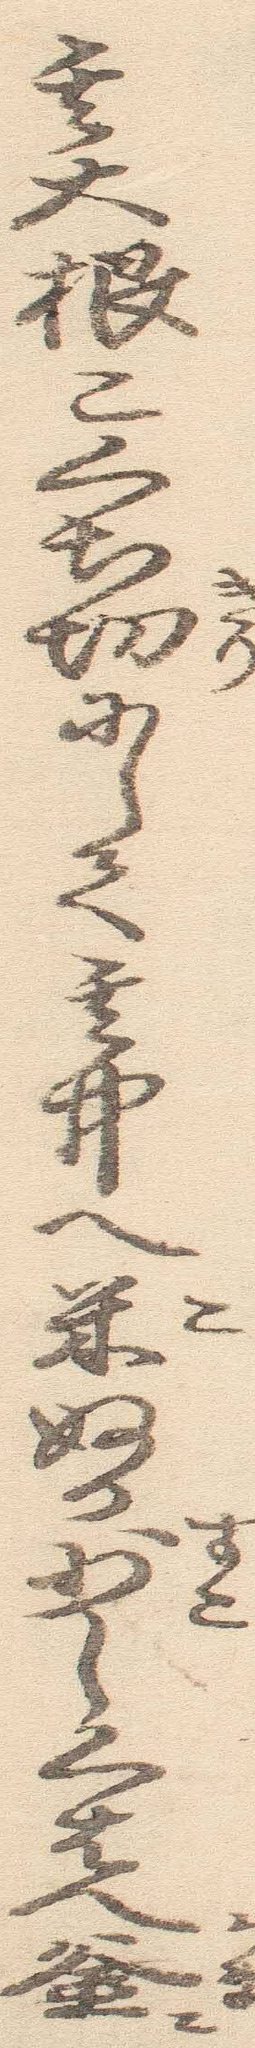其大根こくち切にして其中へ米ぬか少しくはへ釜に
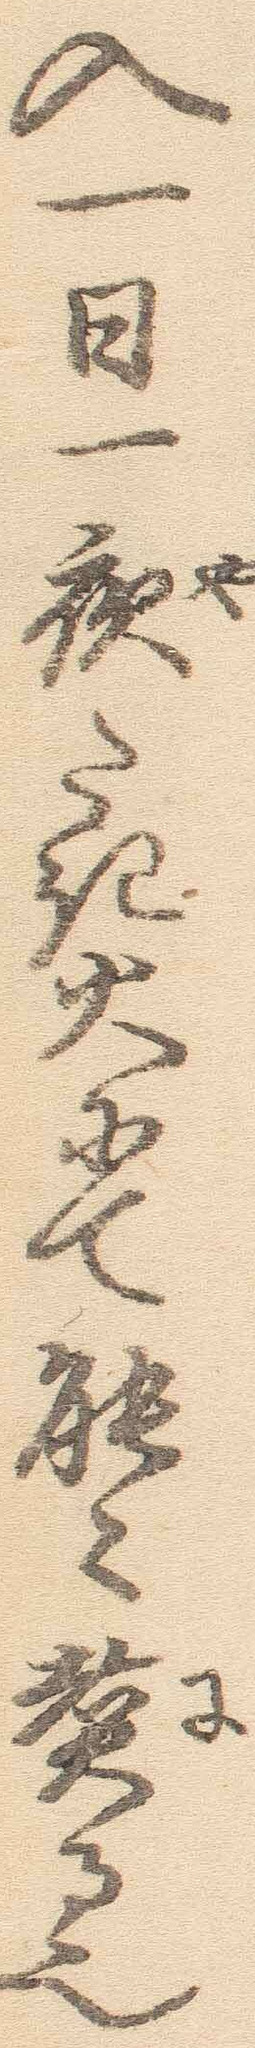入一日一夜たき火にて能々煮る也

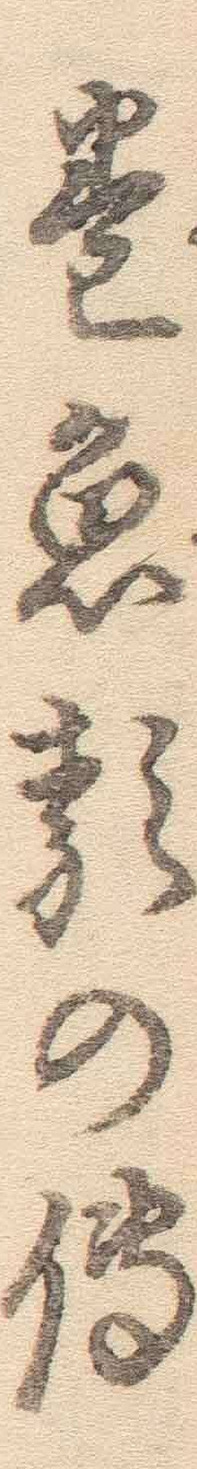巻魚類の伝
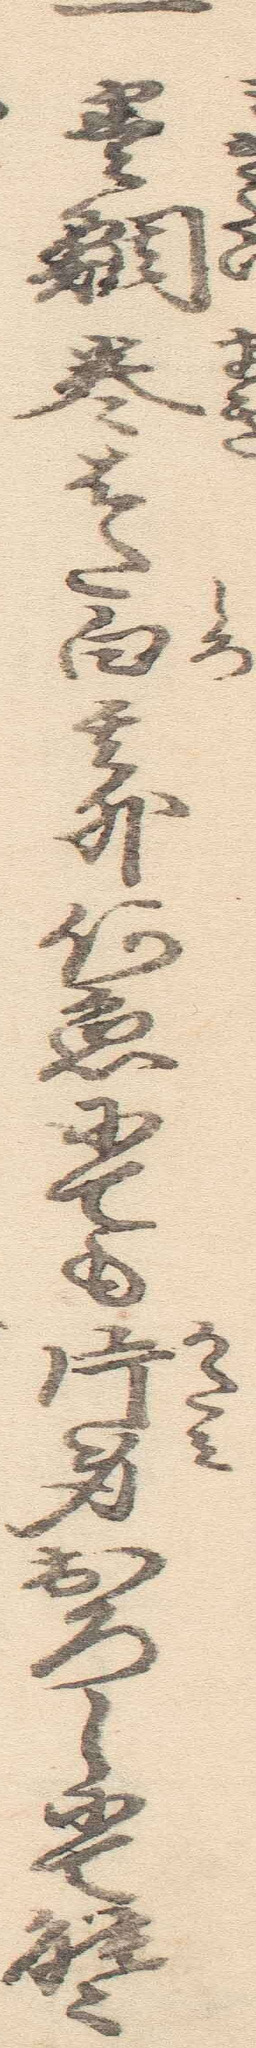一巻鯛巻はた白其外何魚にても片身おろしにて能々
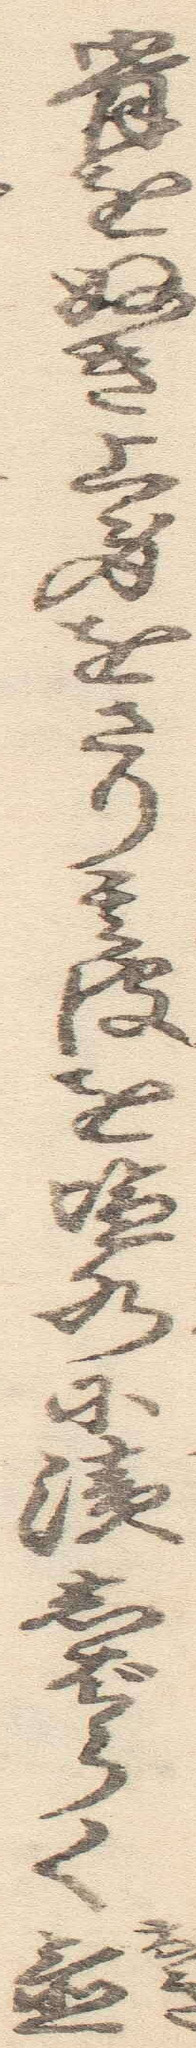骨をぬき上身をさり其皮を塩水に漬しばらく置
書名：料理通
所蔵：東京学芸大学附属図書館 国文学研究資料館
